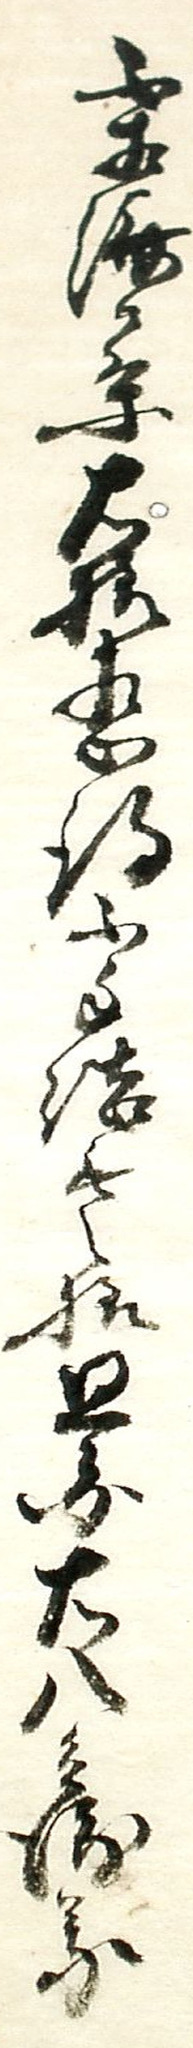不相済候条右様相心得不手詰無之様且亦右八兵衛義
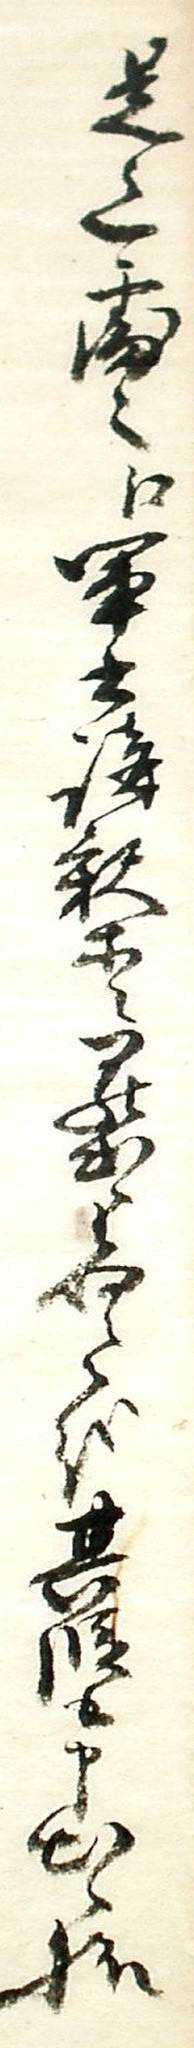是迄處々江軍書講釈等ニ罷出候者ニ候哉其段も申出候様
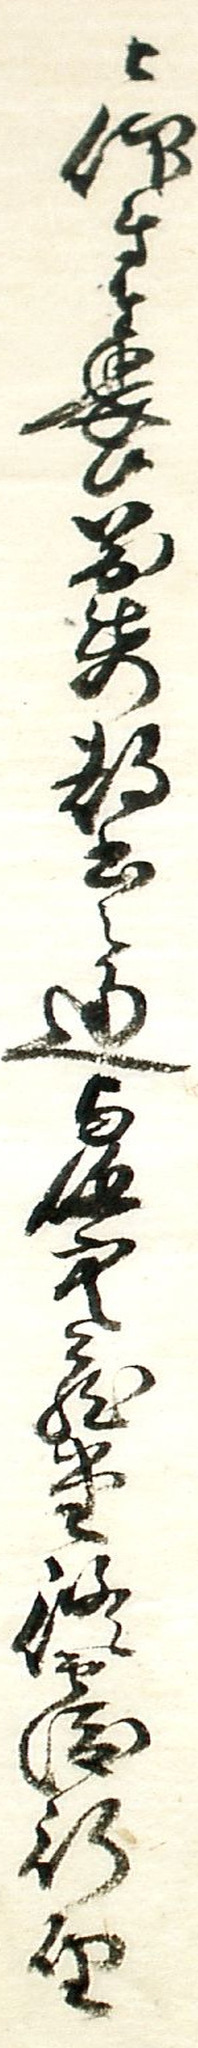被仰付奉畏候別帋都書之通虚空蔵堂修覆行届
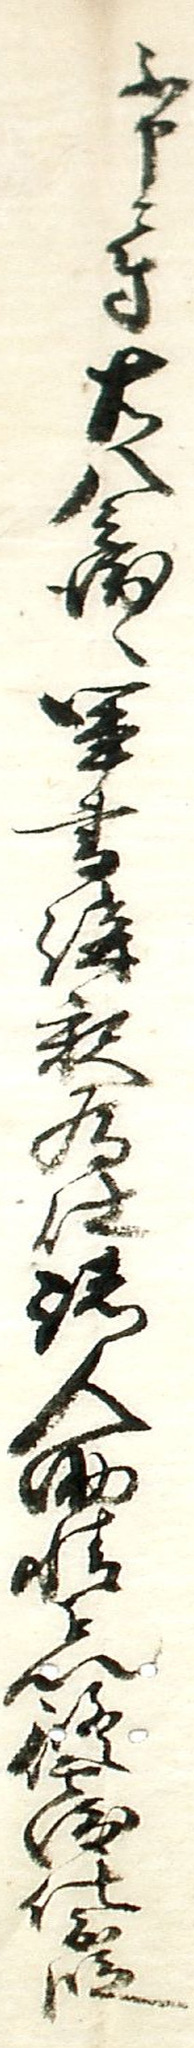不申ニ付右八兵衛へ軍書講釈為仕諸人助情を以修覆仕度段
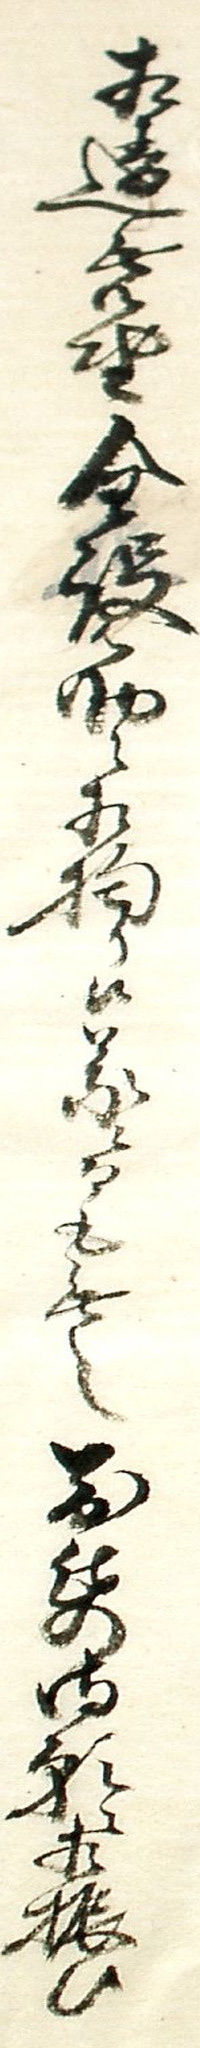相違無御坐全役筋ニ相拘り候義ニ而も無之別帋御願ニ相振候
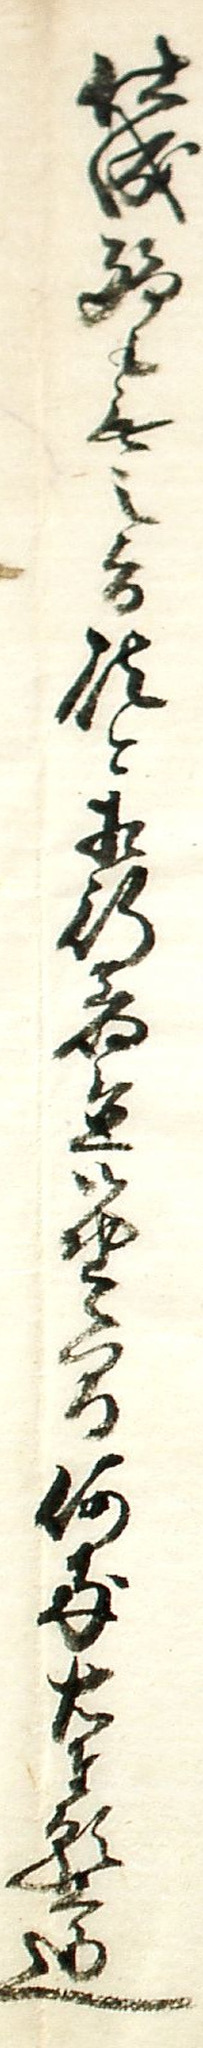仕成聊も無之旨屹と相行着置御坐候間何卒右奉願之通
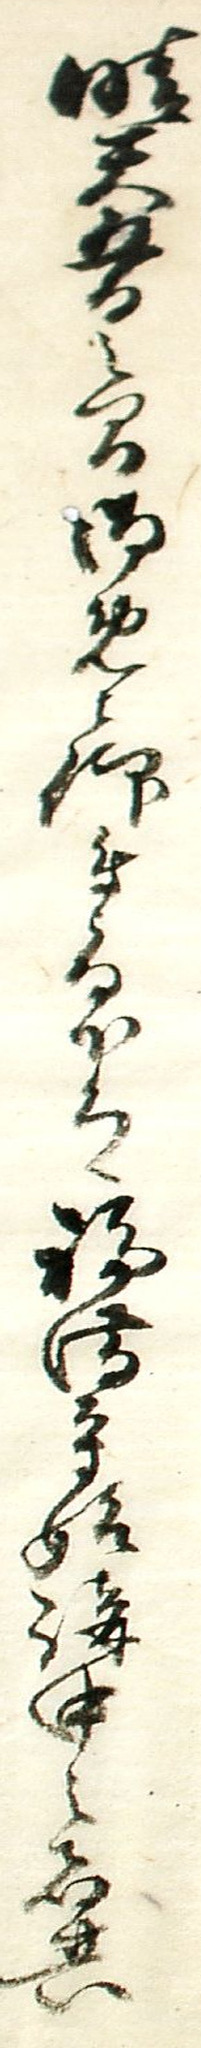晴天五日之間御免被仰付被為下候ハヽ福満寺始講中之者共
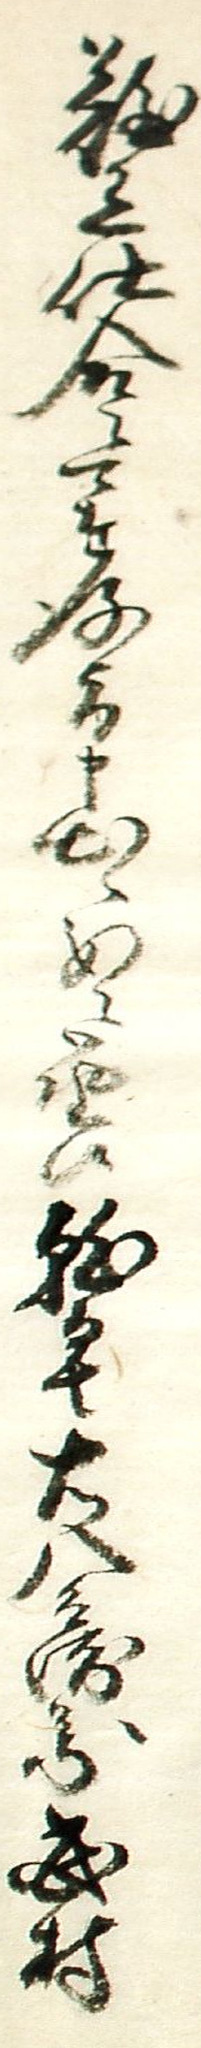難有仕合ニ可奉存旨申出候義ニ御坐候就而者右八兵衛義當村
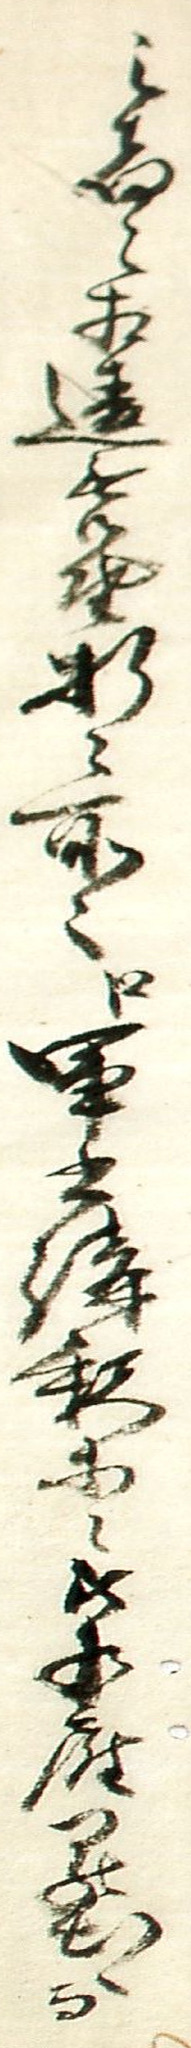之者ニ相違無御坐折々所々江軍書講釈等ニ被相雇罷出候而
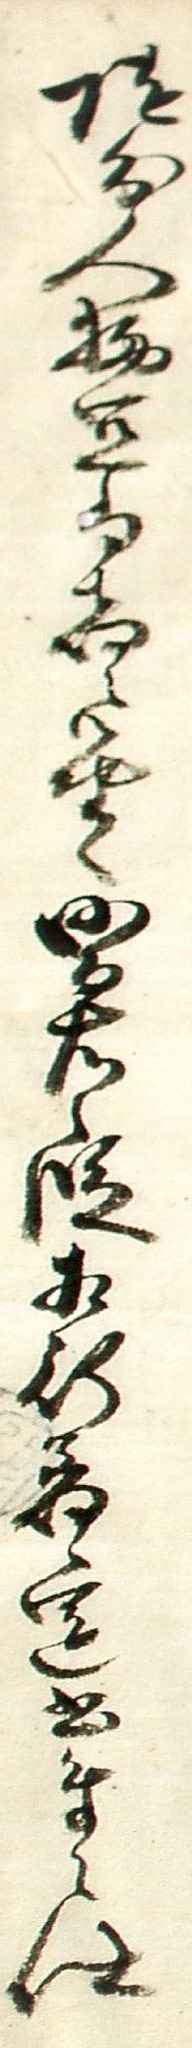随分人柄宜布者ニ御坐候仍而右之段相行着候運書付ニ仕
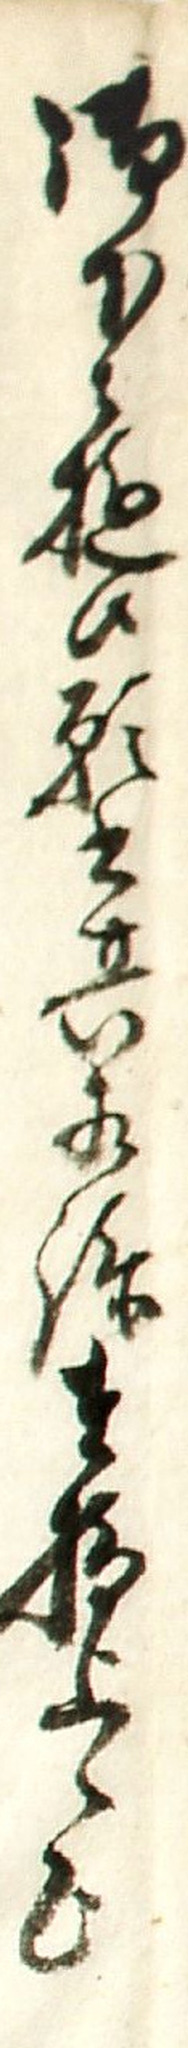御下被遊候願書共相添奉指上候以上
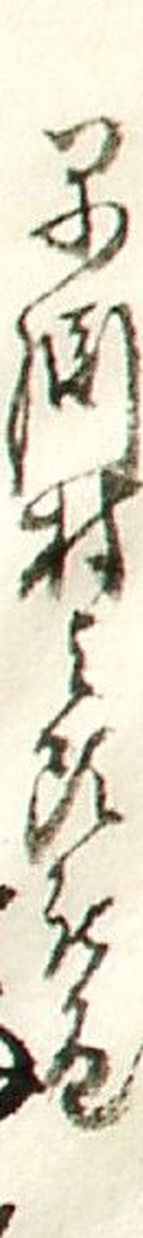早渕村与頭庄屋
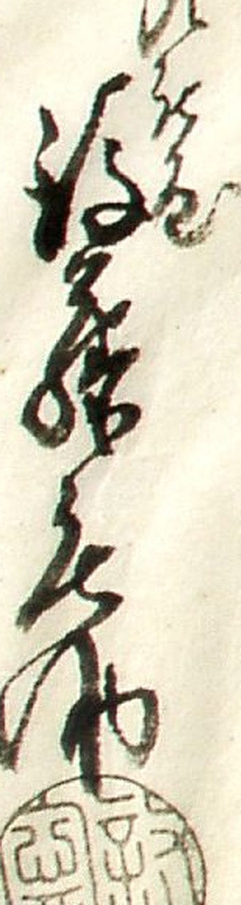後藤庄助

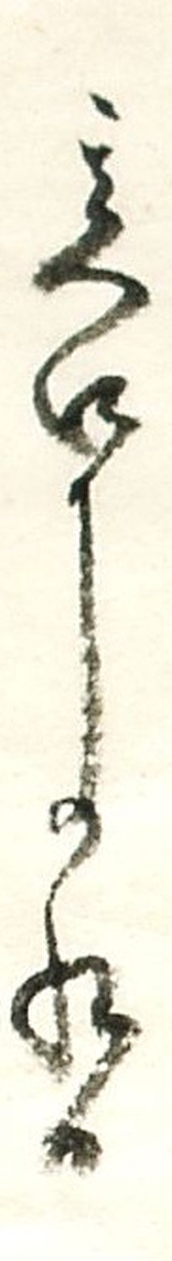亥四月九日
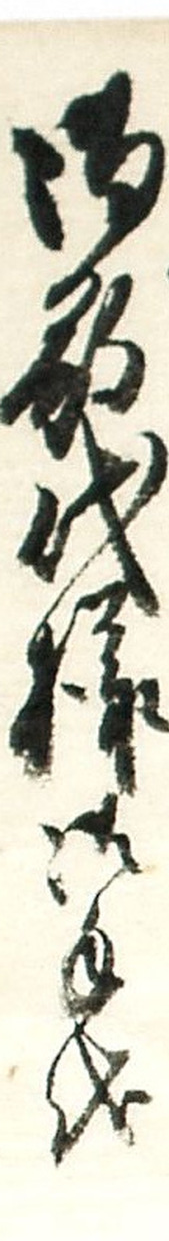御郡代様御手代
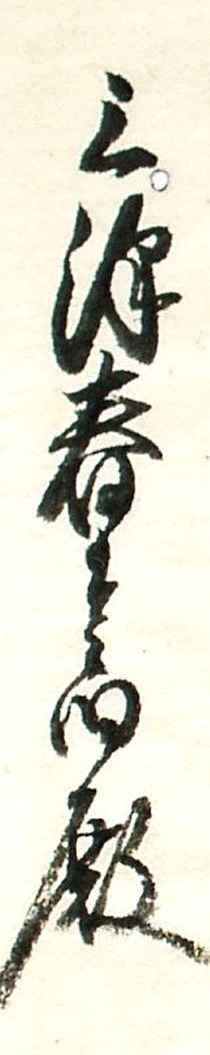三澤春太郎殿
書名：(早渕村福満寺子ども浄瑠璃願紙面）他
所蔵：鳴門教育大学 Naruto University of Education
